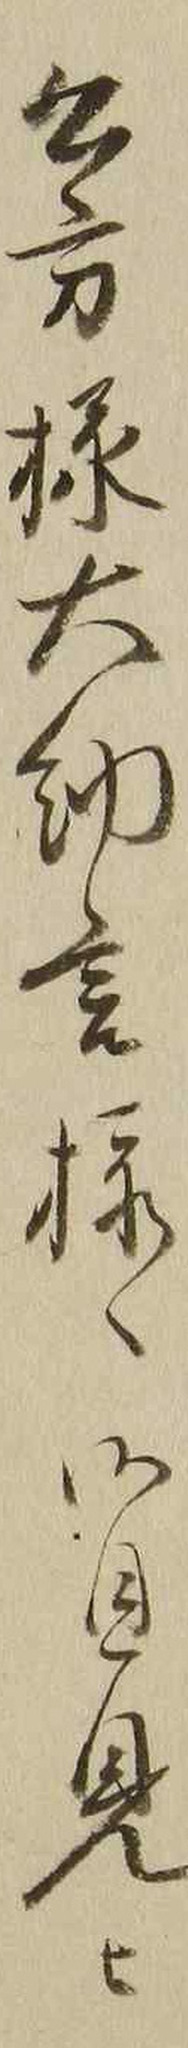公方様大納言様御目見被
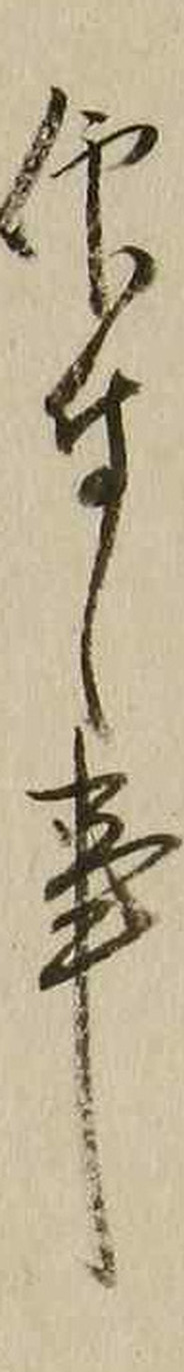仰付候事
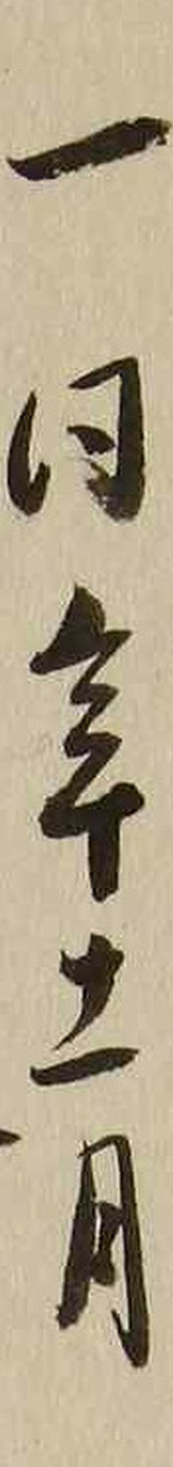一同年十一月
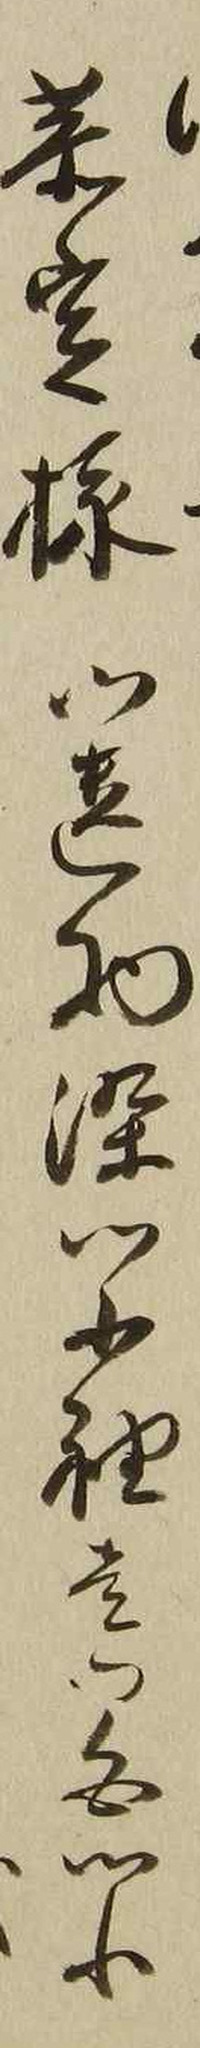恭定様御遺物染御小袖壱つ色御小
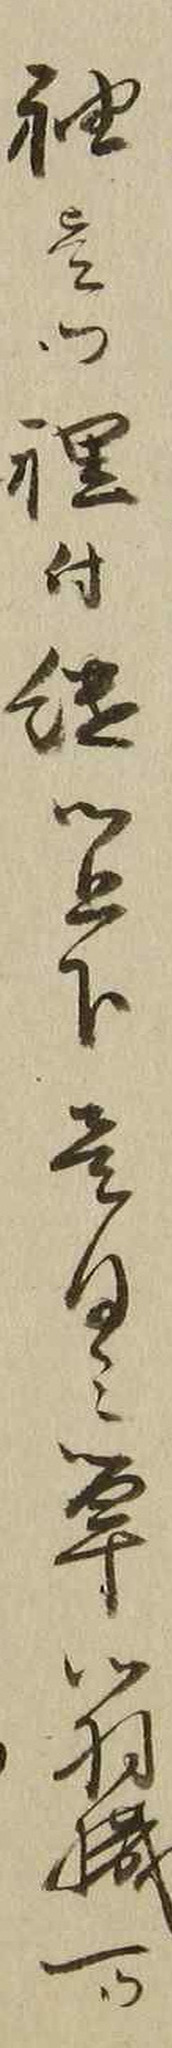袖壱つ裏付継御上下壱具に単御羽織一つ
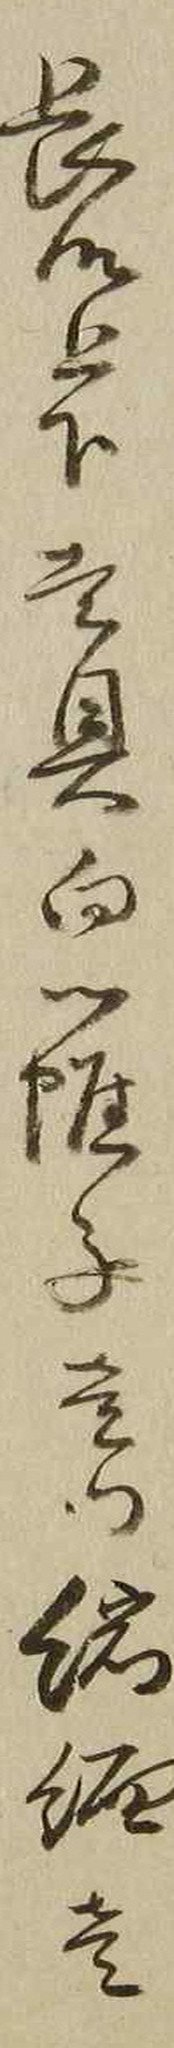長御上下壱具白御帷子壱つ縮緬壱
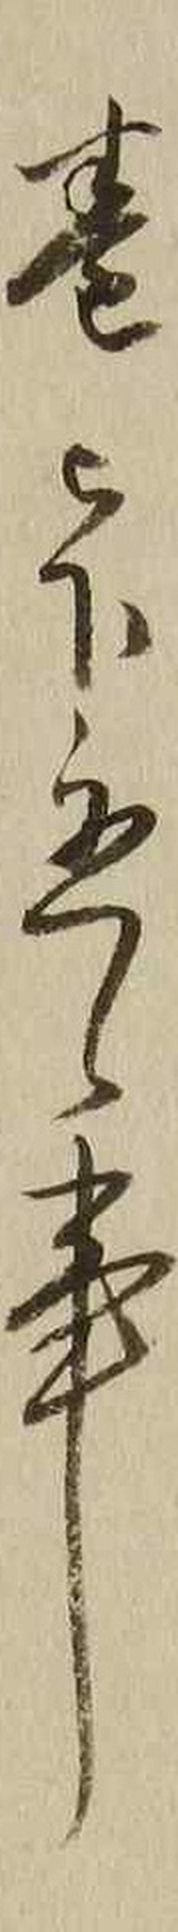巻被下置候事
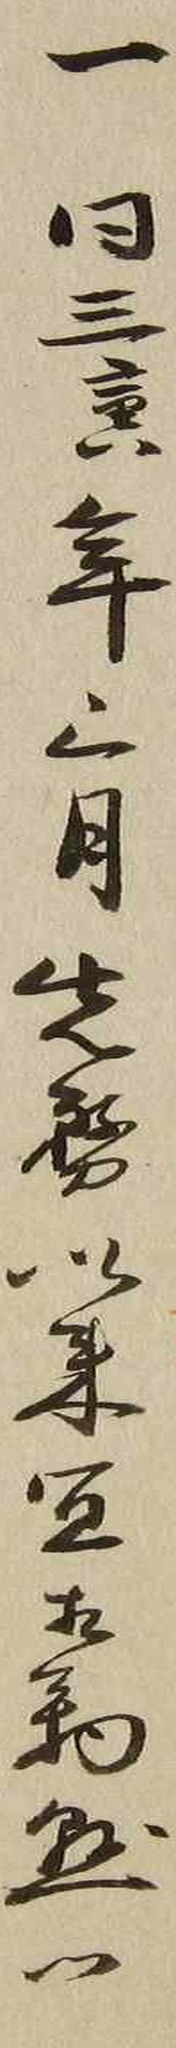一同三寅年三月先務以来宜相勤懸御
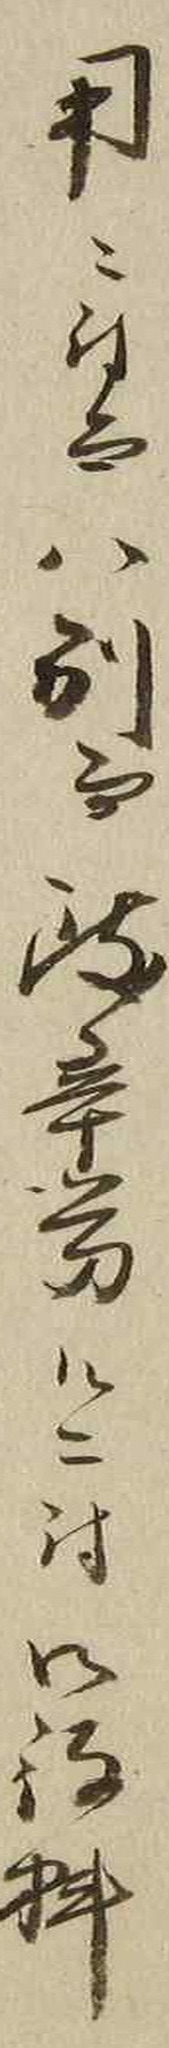用に付而は別而致辛労候に付御役料
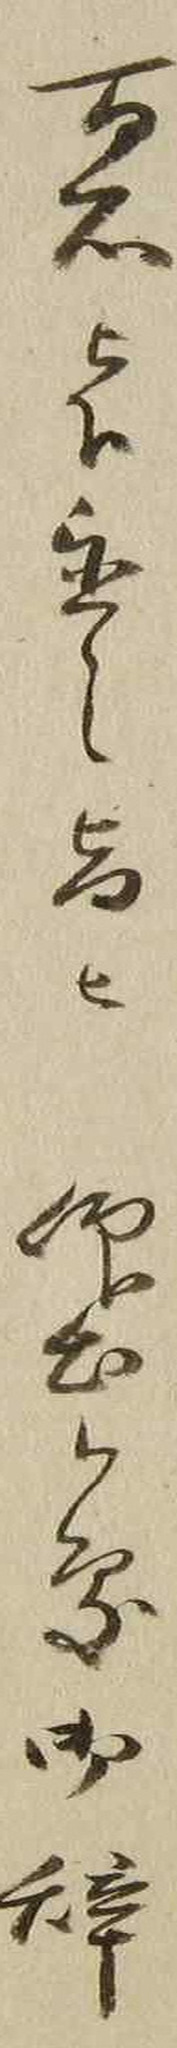百石被下置候旨被仰出候処御辞
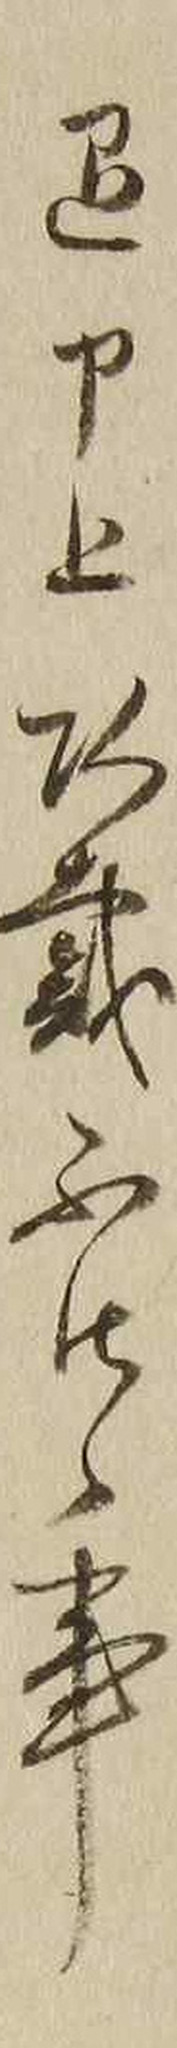退申上頂戴不仕候事
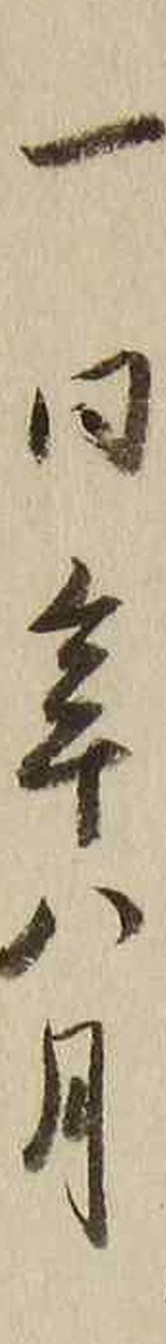一同年八月
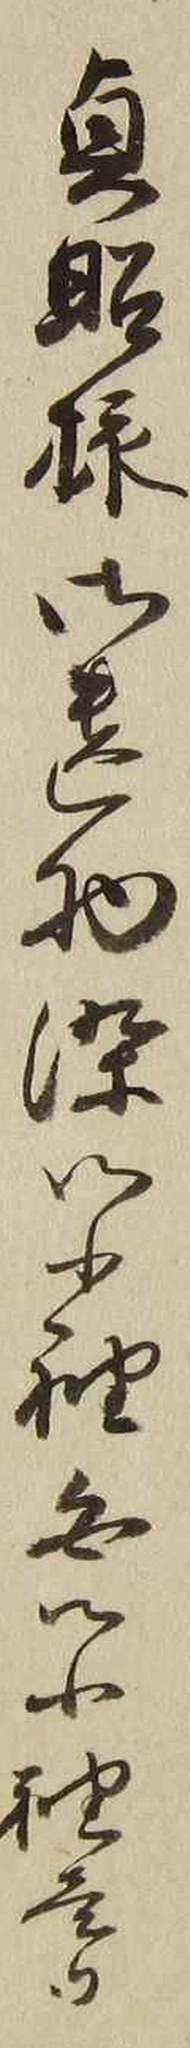貞昭様御遺物染御小袖壱つ色御小袖壱つ
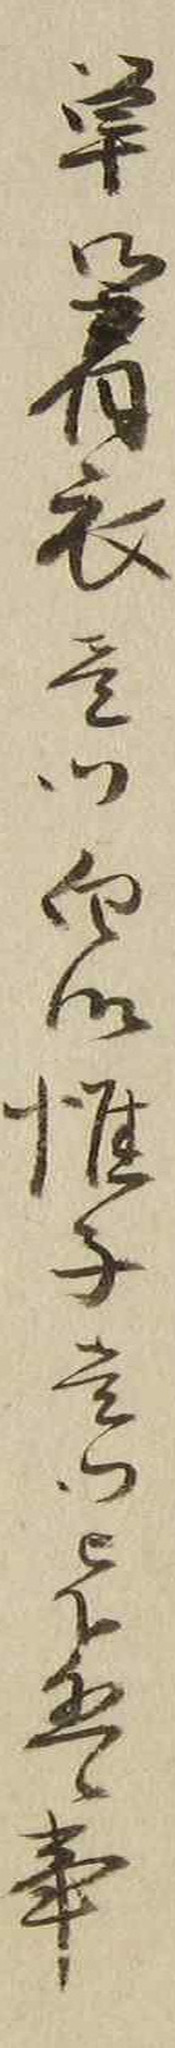単御肩衣壱つ白御帷子壱つ被下置候事
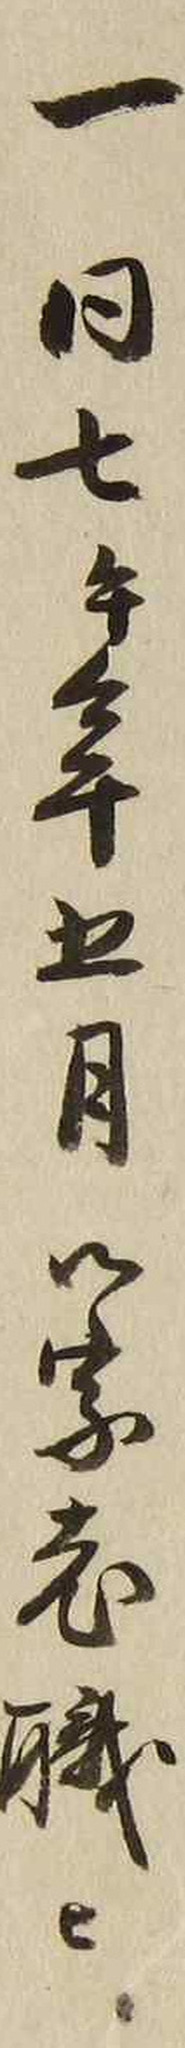一同七午年五月御家老職被
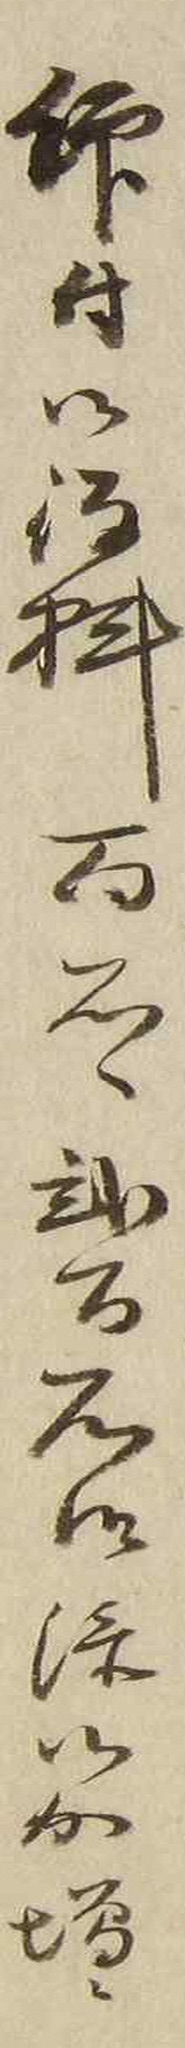仰付御役料百石へ弐百石御添御加増に
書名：諸士系譜　巻之269　さ之部1
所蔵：会津若松市立会津図書館
